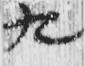九
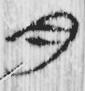月
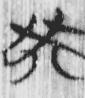癸
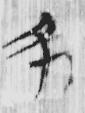丑
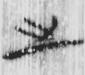之
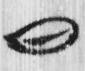日
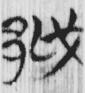○（越）
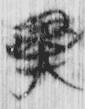異
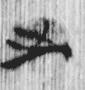之
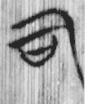司
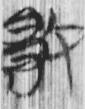敗
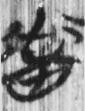番
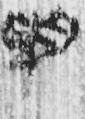受
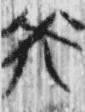癸
